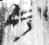凡
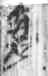寍（寧）
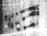日
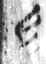利（利）
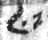㠯（以）
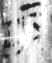取（娶）
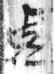妻
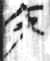內（入）
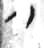人
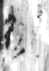○（徙）
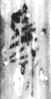○（家）
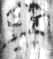室
